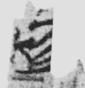閵
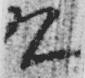九
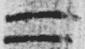二
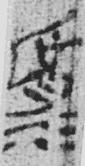○（曳）
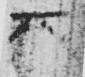亓（其）
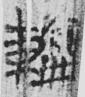輪
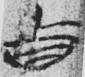貞
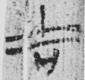吉
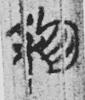利
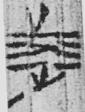涉
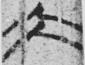大
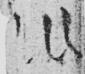川
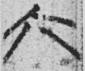六
